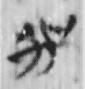加
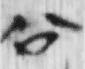公
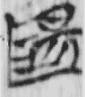○（陽）
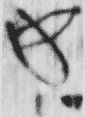女
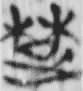楚
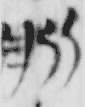斨
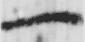一
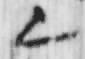乙
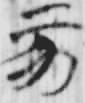亥
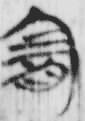酓（熊）
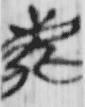鹿
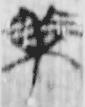样
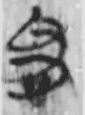快
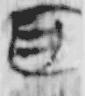耳
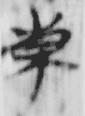東
